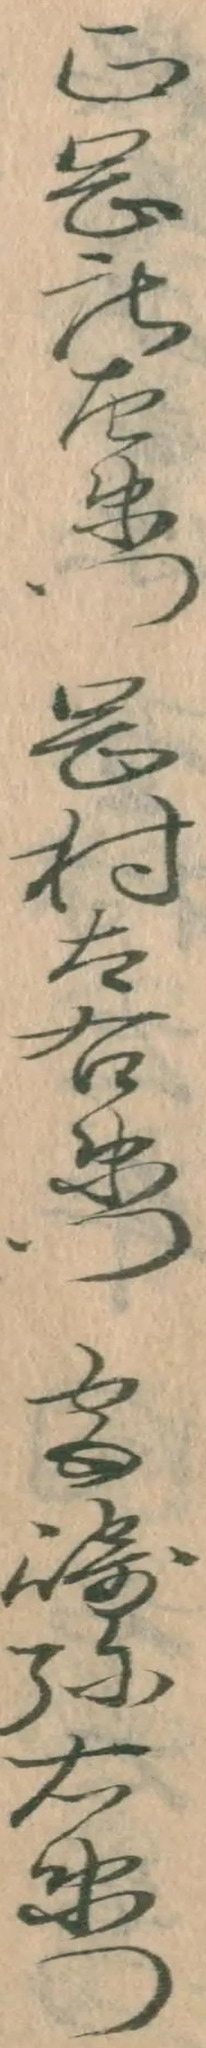正岡庄左衛門岡村太右衛門宮崎弥右衛門
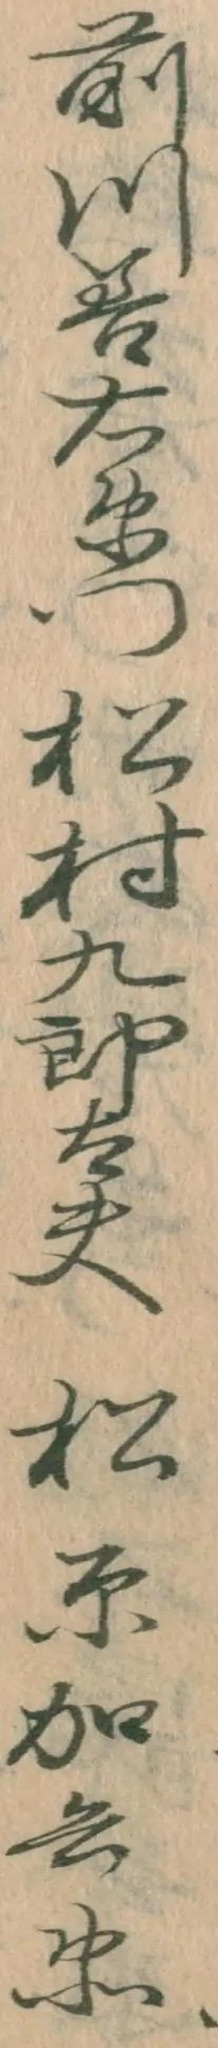前川前右衛門松村九郎太夫松原加兵衛
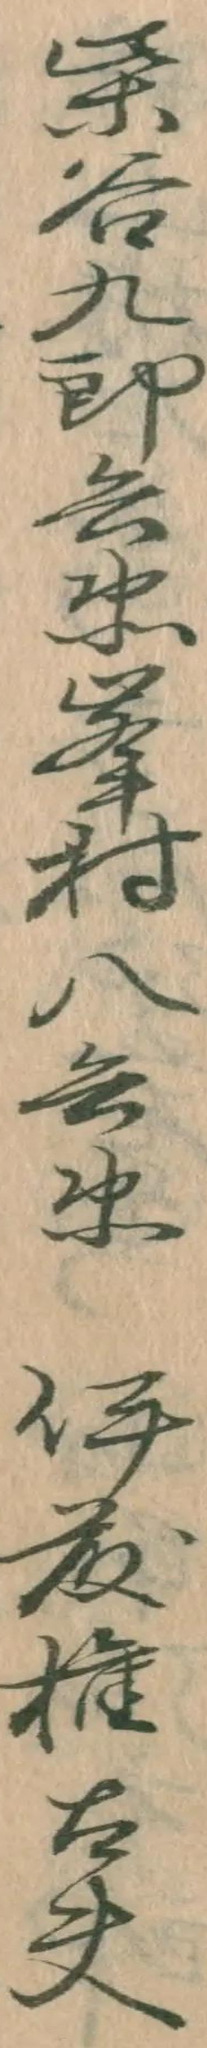柴谷九郎兵衛峯村八兵衛伊藤権太夫
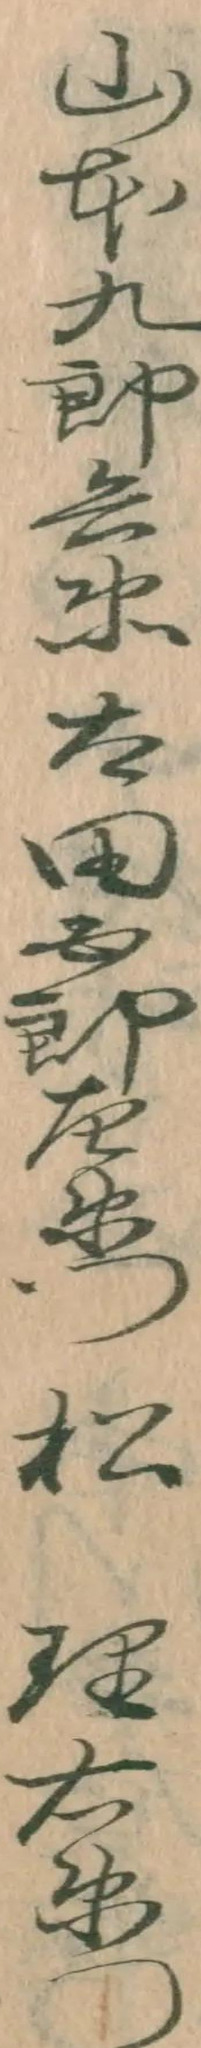山本九郎兵衛太田五郎左衛門松理右衛門
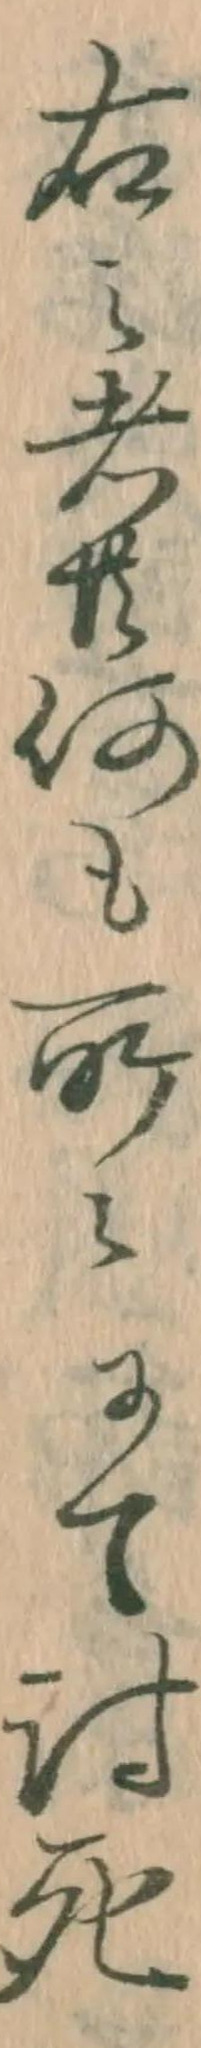右の者共何も所々尓て討死
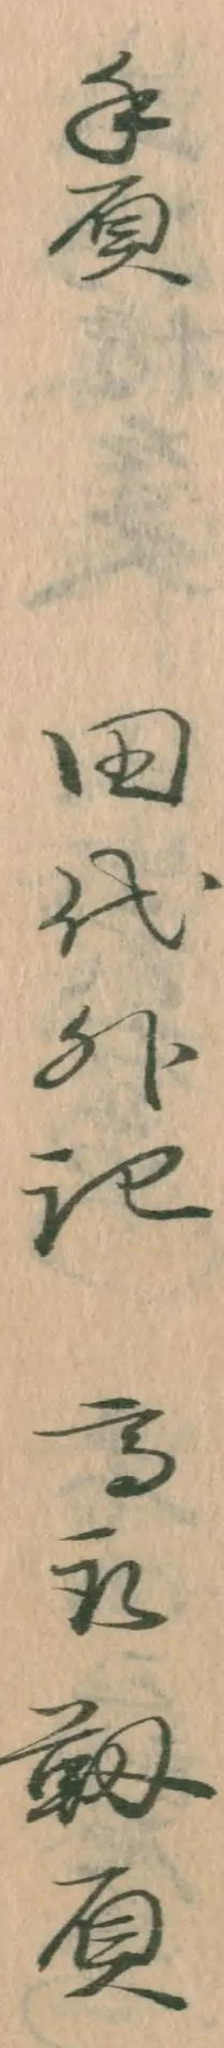手負田代外記高取靭負
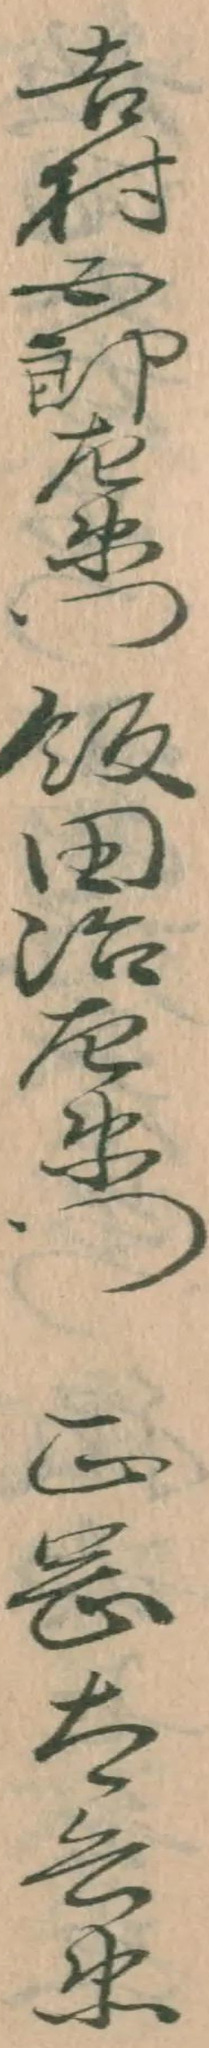吉村五郎左衛門飯田治左衛門正岡太兵衛
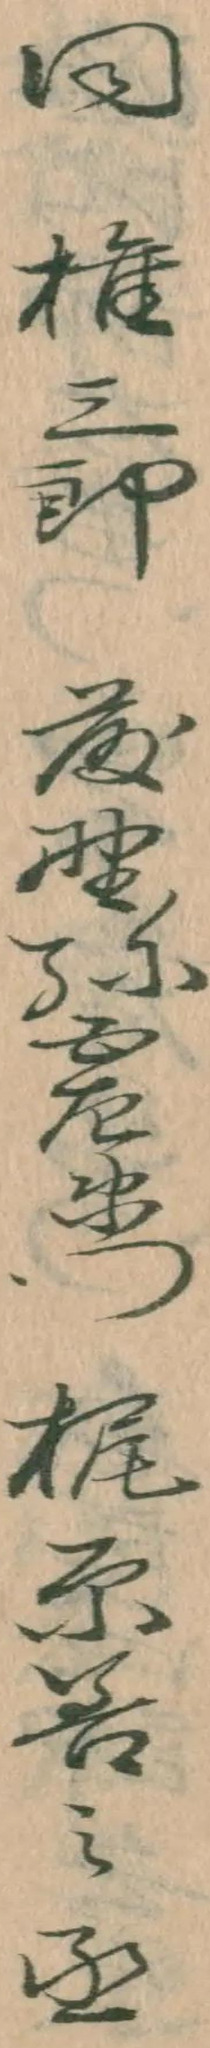同権三郎藤野弥五左衛門梶原善之丞
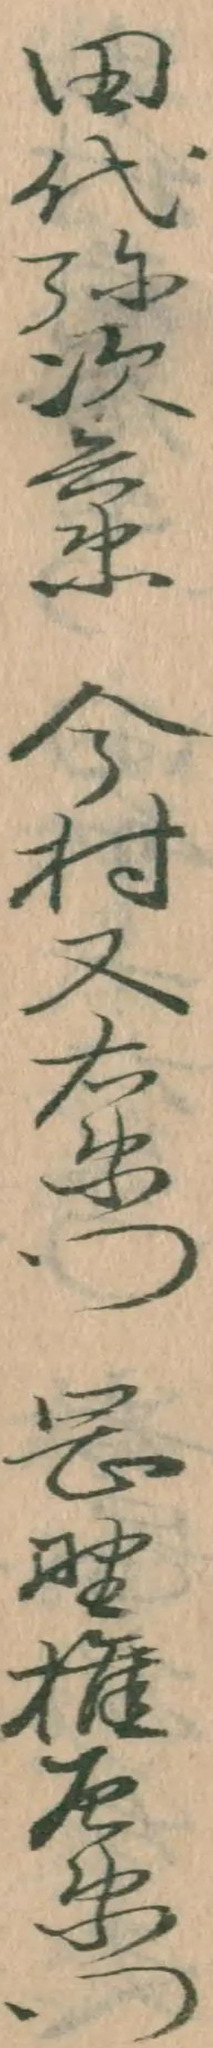田代弥次兵衛今村又右衛門岡野権左衛門
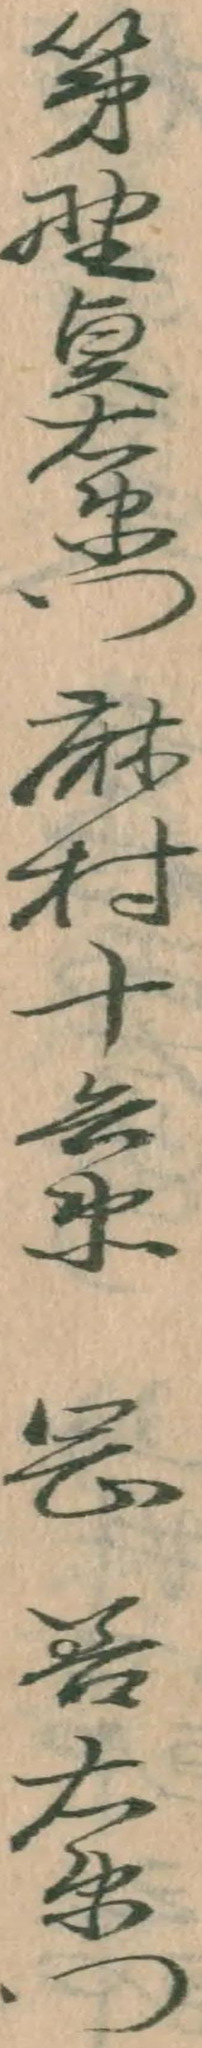第野貞右衛門麻村十兵衛岡善右衛門
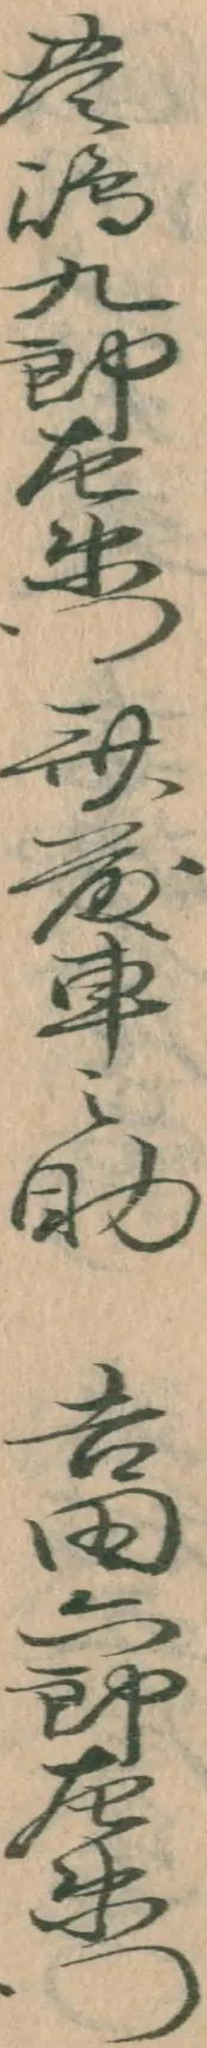豊島九郎左衛門斎藤車之助吉田六郎左衛門
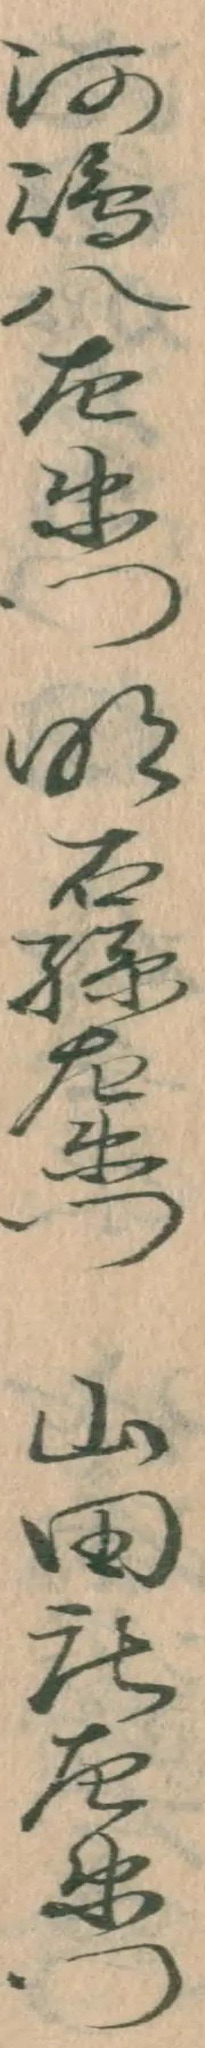河島八左衛門明石孫左衛門山田庄左衛門
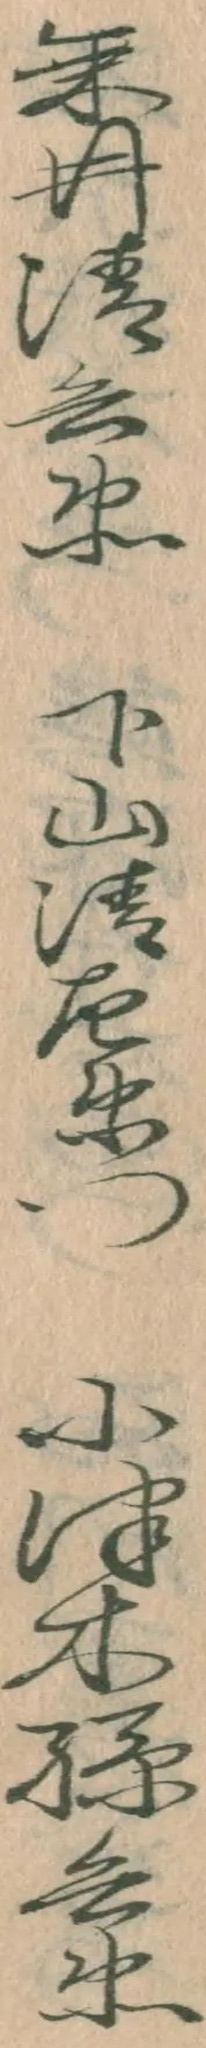乗井清兵衛下山清左衛門小津木孫兵衛
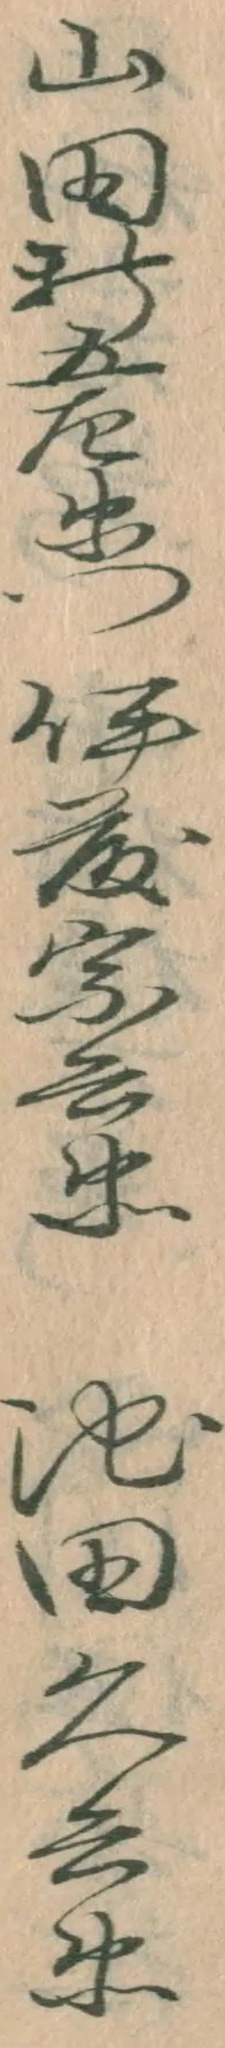山田新五左衛門伊藤宗兵衛池田久兵衛
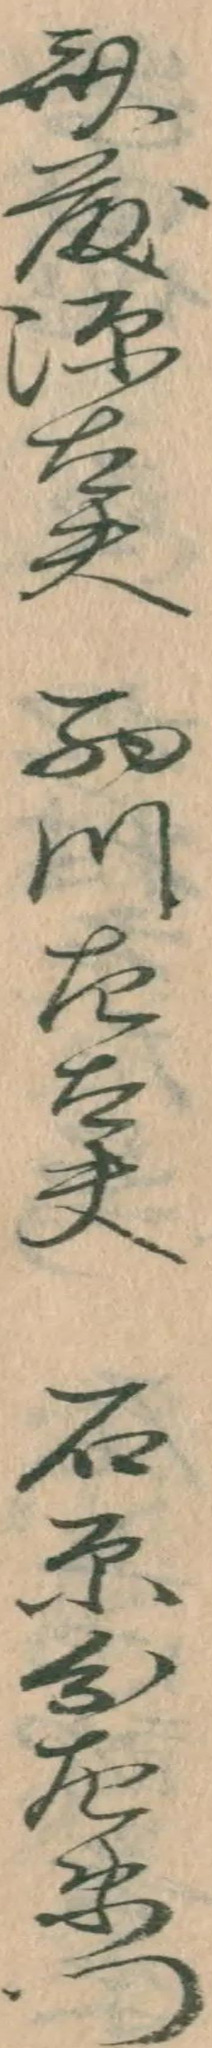斎藤源太夫西川佐太夫石原分左衛門
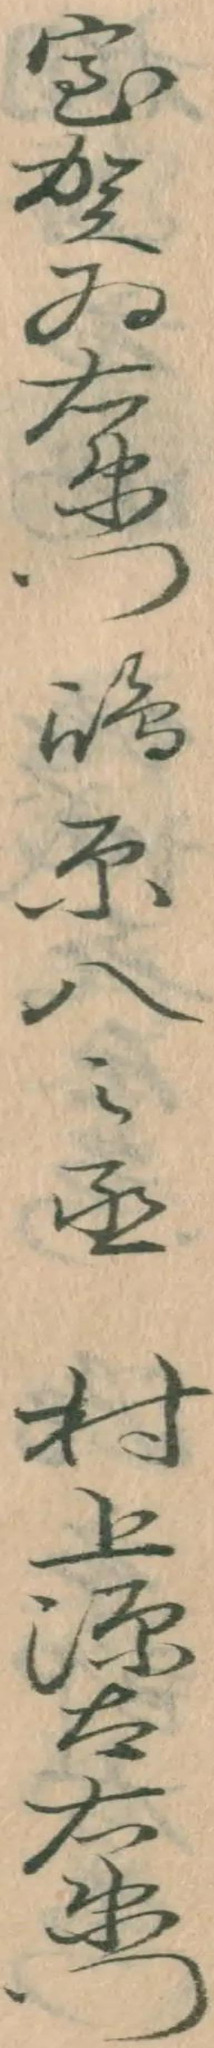宝賀ゐ右衛門島原八之丞村上源太右衛門
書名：切支丹御退治記 49巻. [9]
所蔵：国立国会図書館 National Diet Library, JAPAN
